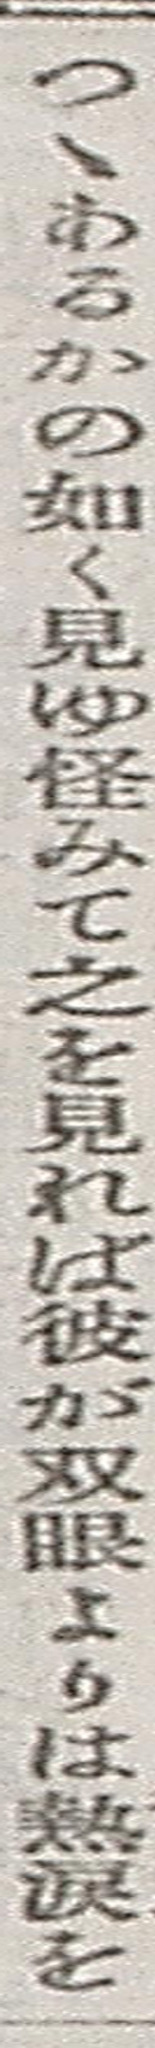つゝあるかの如く見ゆ怪みて之を見れば彼が双眼よりは熱涙を
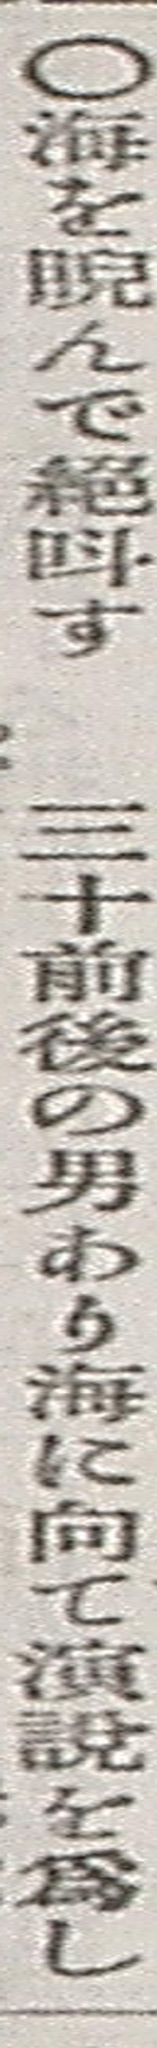○海を睨んで絶叫す三十前後の男あり海に向て演説を為し
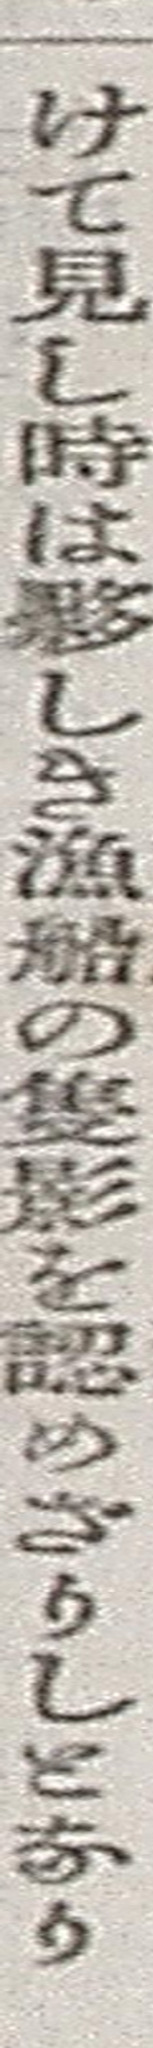けて見し時は夥しき漁船の隻影を認めざりしとなり
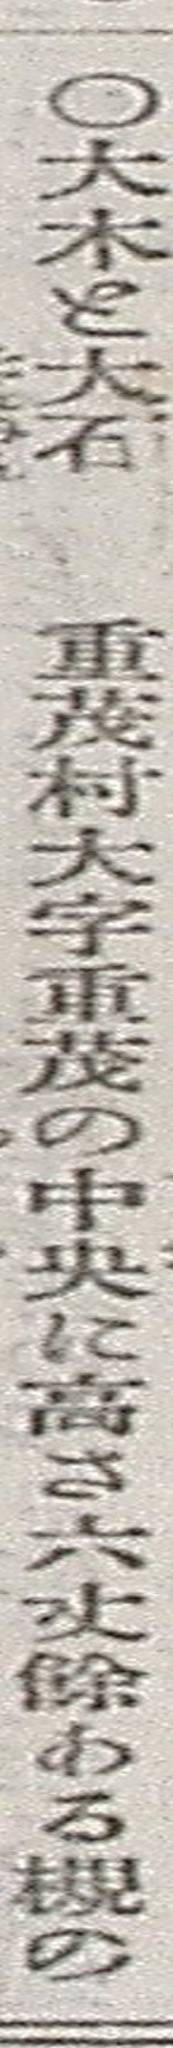○大木と大石重茂村大字重茂の中央に高さ六丈余ある槻の
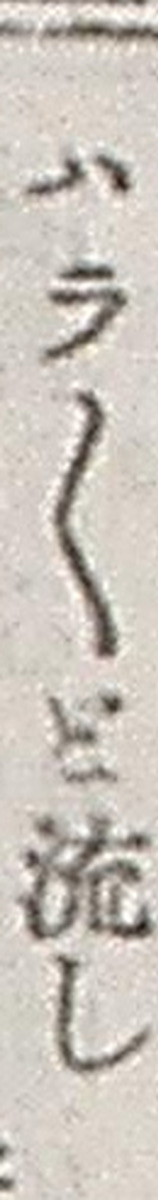ハラ〳〵と流し
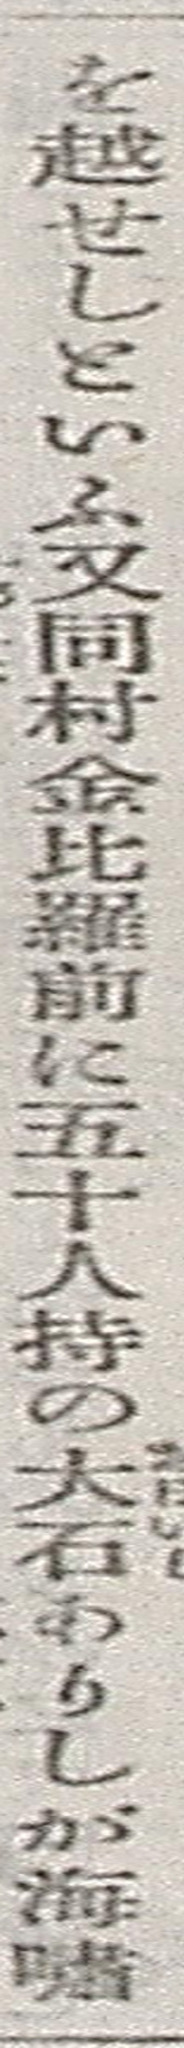を越せしといふ又同村金比羅前に五十人持の大石ありしが海嘯
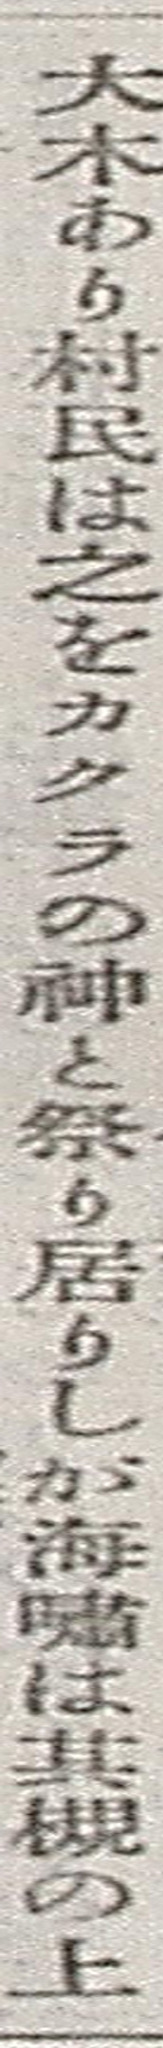大木あり村民は之をカクラの神と祭り居りしが海嘯は其槻の上
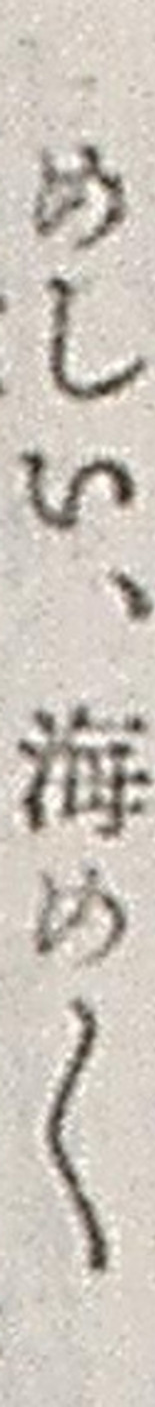めしい、海め〳〵
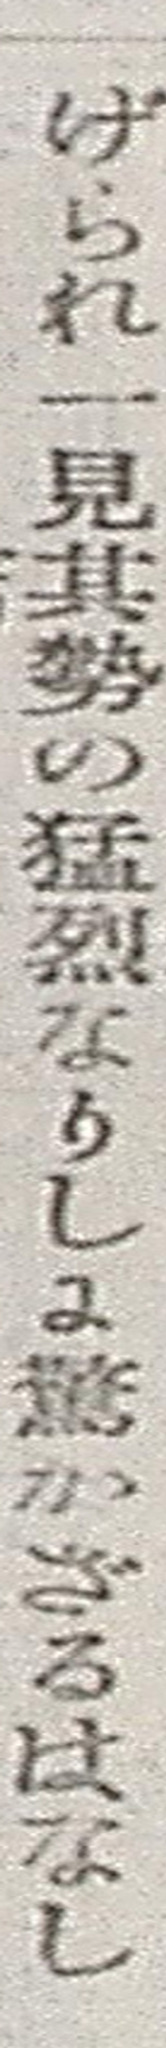げられ一見其勢の猛烈なりしに驚かざるはなし
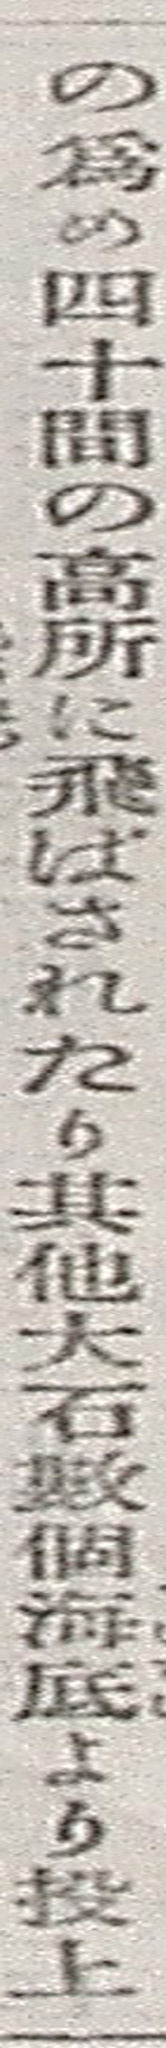の為め四十間の高所に飛ばされたり其他大石数個海底より投上
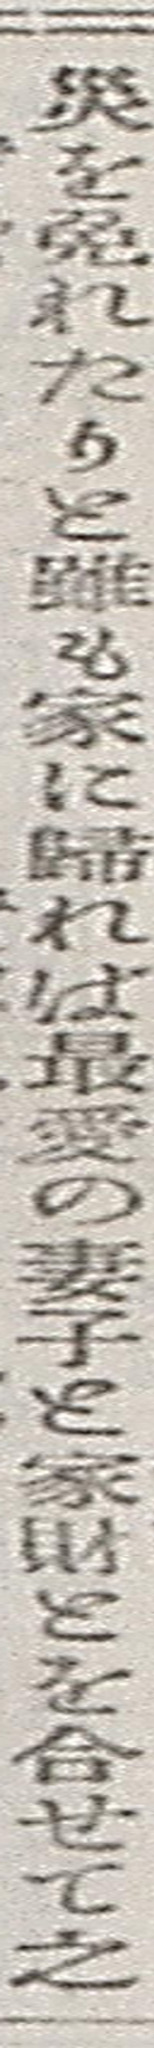災を免れたりと雖も家に帰れば最愛の妻子と家財とを合せて之
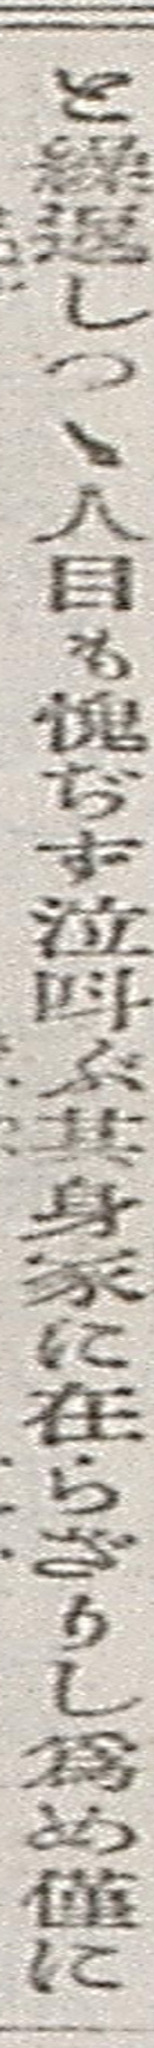と繰返しつゝ人目も愧ぢず泣叫ぶ其身家に在）あ）らざりし為め僅に
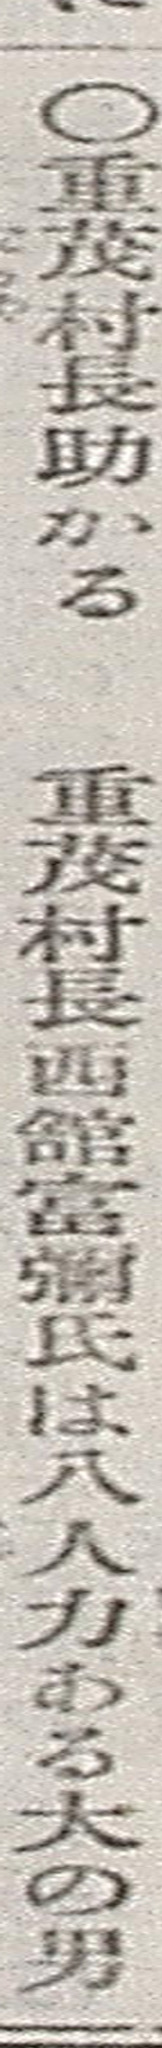○重茂村長助かる重茂村長西舘富彌氏は八人力ある大の男
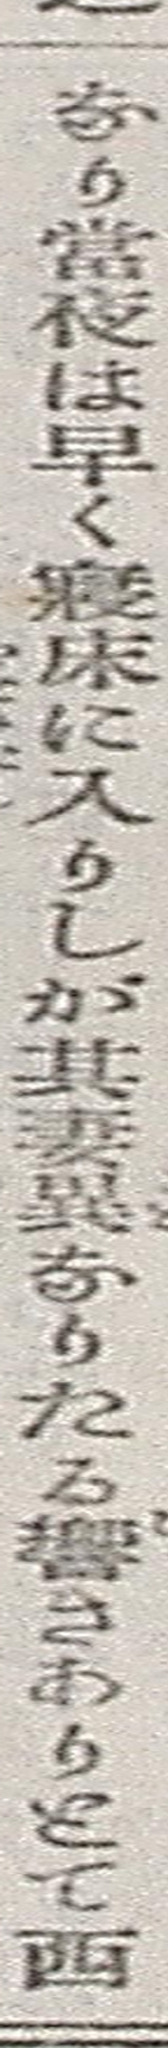なり当夜は早く寝床に入りしが其妻異なりたる響きありとて西
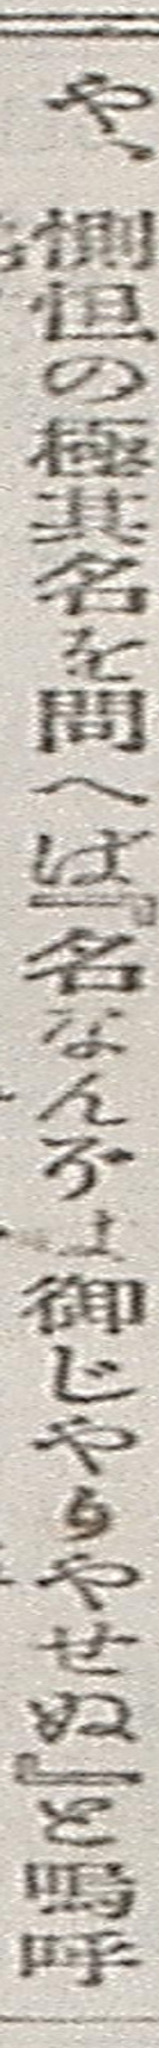や、惻怛の極其名を問へば『名なんぞは御じやりやせぬ』と嗚呼
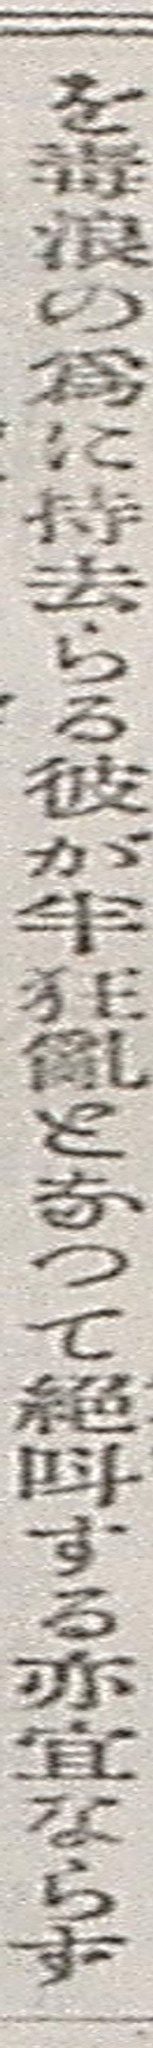を毒浪の為に持去らる彼が半狂乱となつて絶叫する亦宜ならず
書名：風俗畫報臨時増刊第百二十號　大海嘯被害録（下）
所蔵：東京大学地震研究所図書室 Earthquake Research Institute Library, The University of Tokyo, JAPAN
